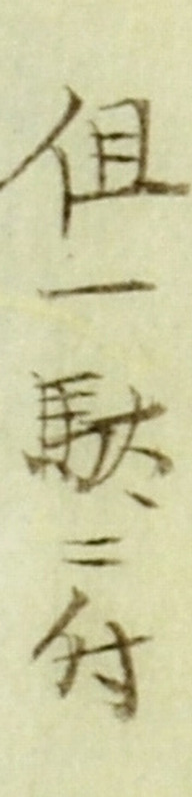但一駄ニ付
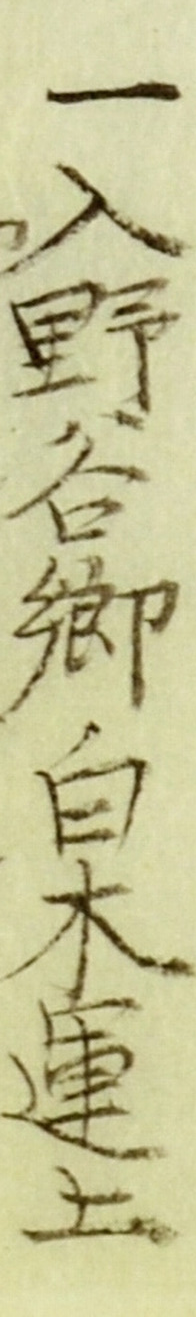一入野谷郷白木運上
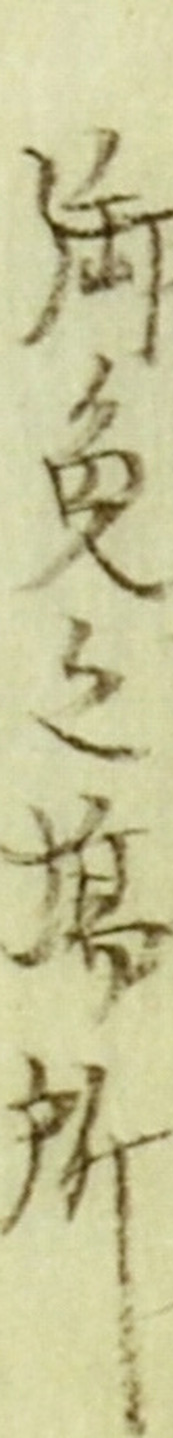御免之場所
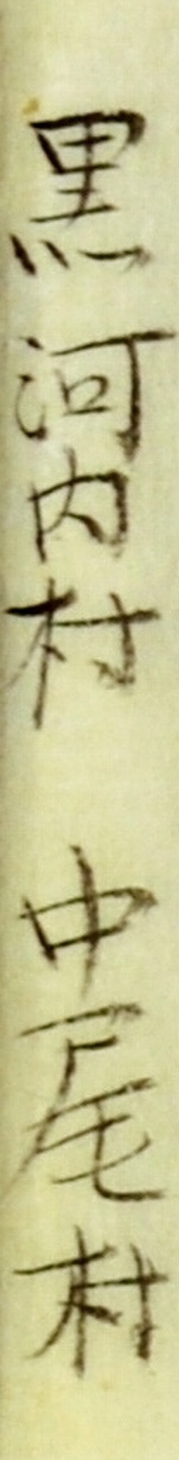黒河内村中尾村

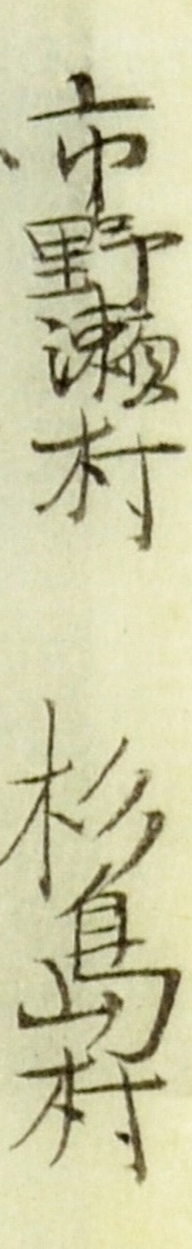市野瀬村杉島村
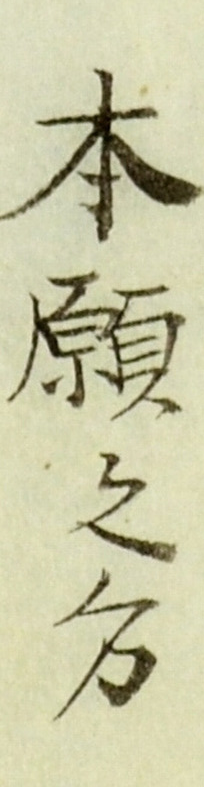本願之分
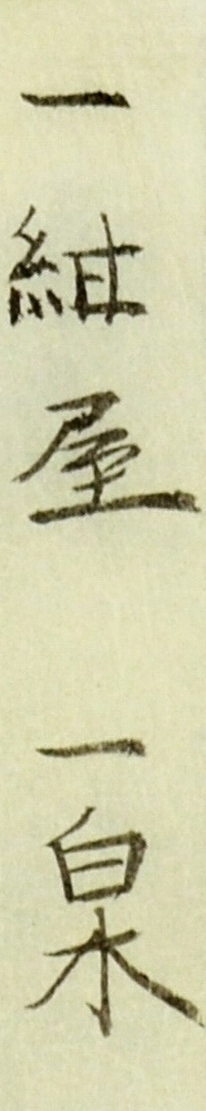一紺屋一白木
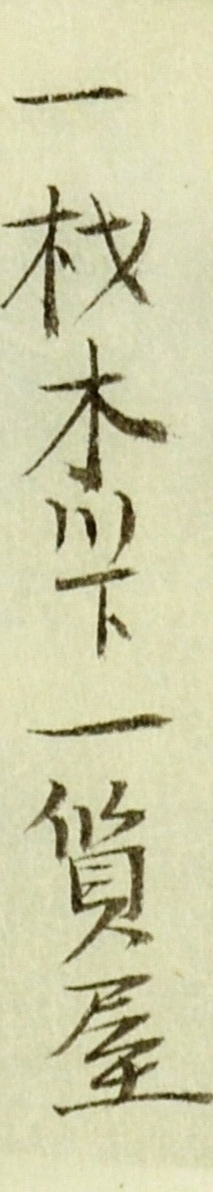一材木以下一質屋
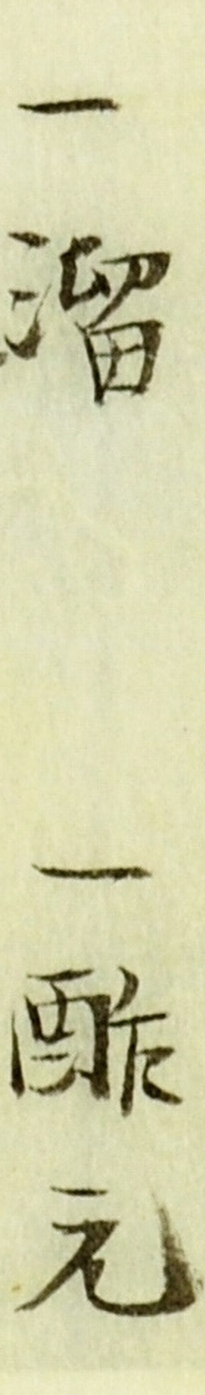一溜一酢元
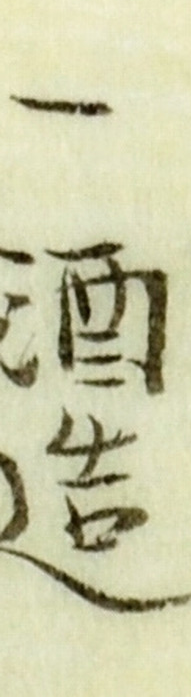一酒造
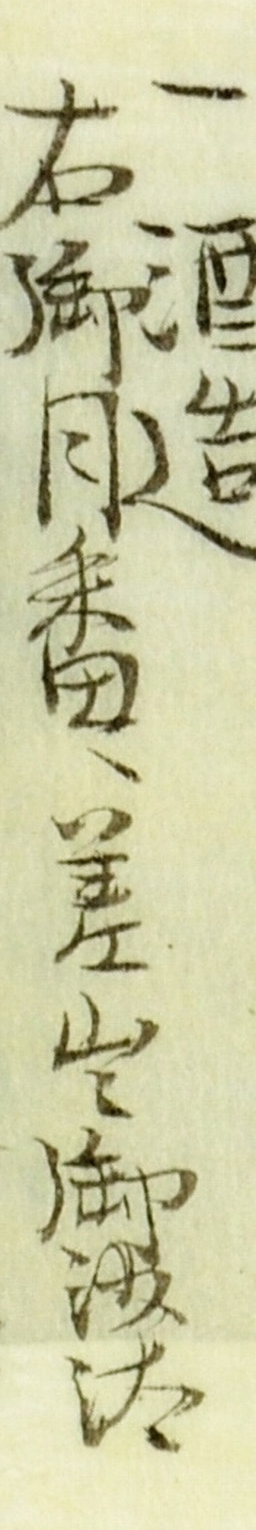右御月番ヘ差出御沙汰
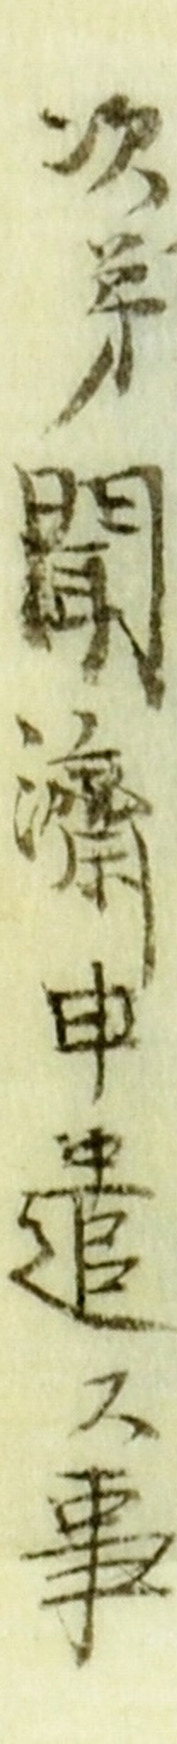次第聞済申遣ス事
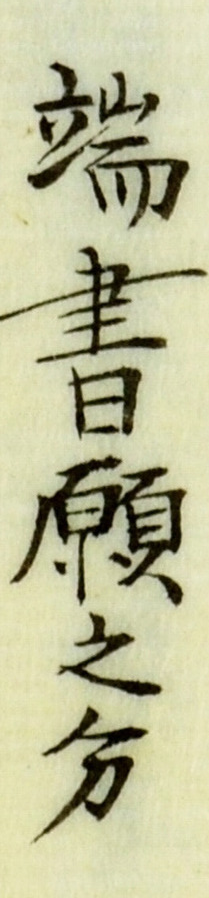端書願之分
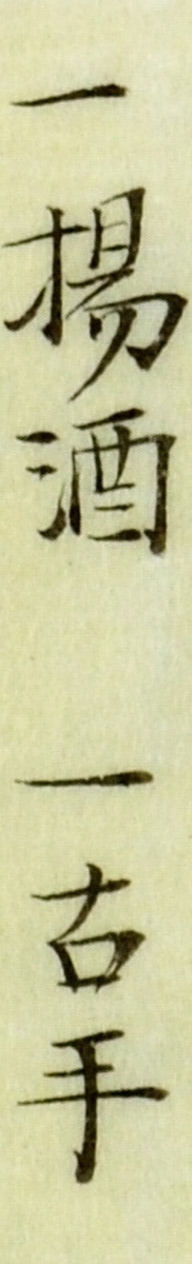一揚酒一古手
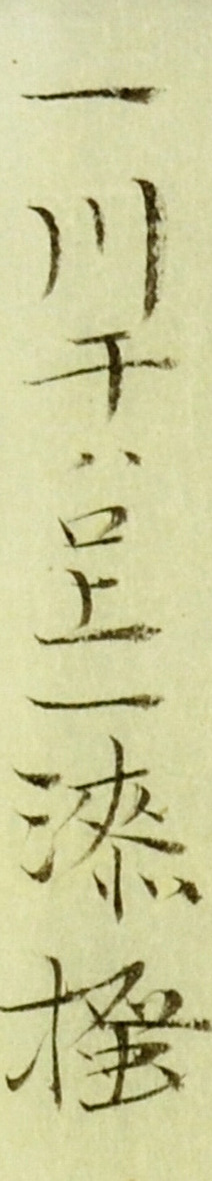一川干ハ口上一漆掻

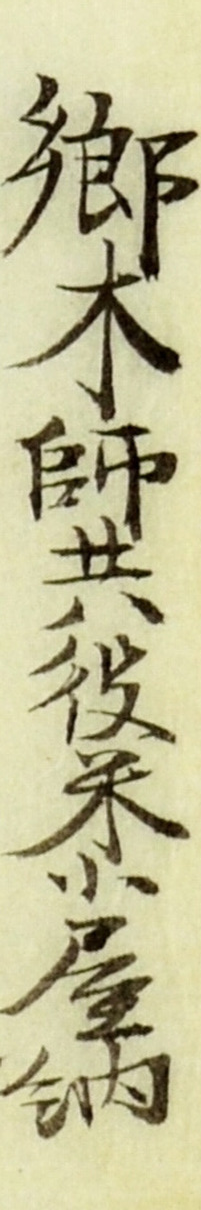郷木師共役米小屋納
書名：分一御定法
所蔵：伊那市立高遠町図書館・合同会社AMANE
